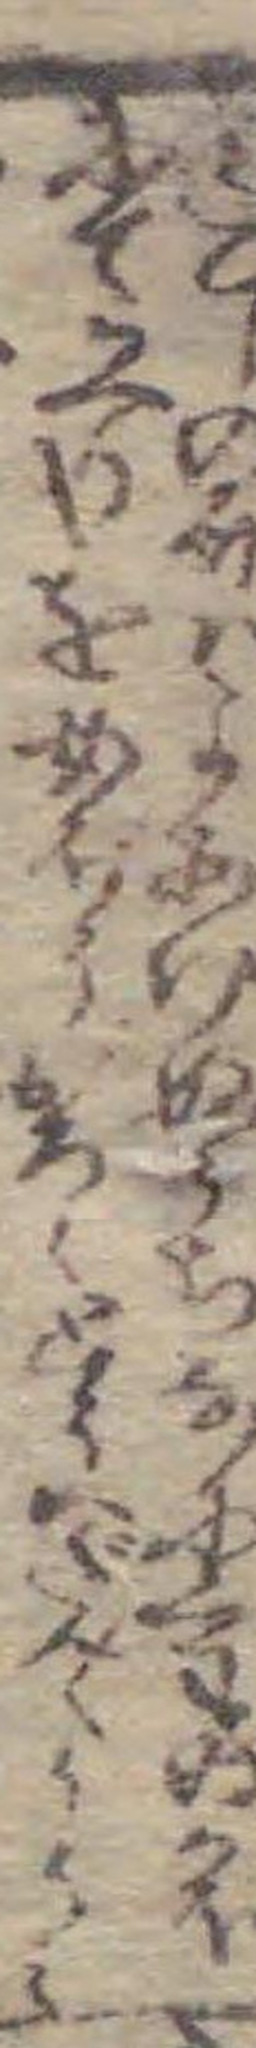にてかへりしを女ぼうおろくとうはだん〳〵うらみ
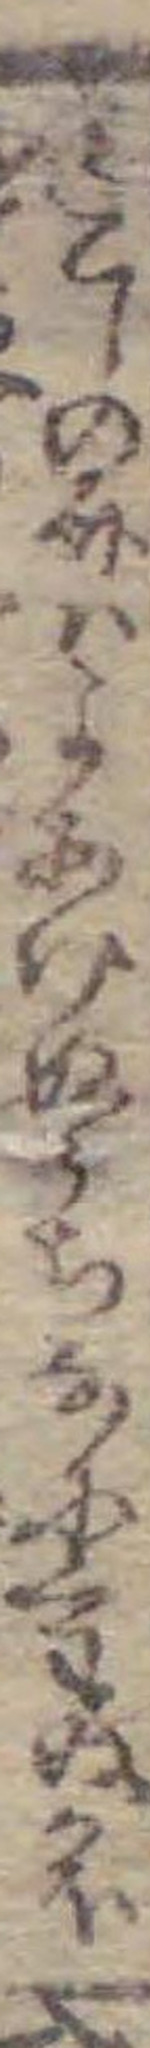みこしの介はよあけぬうちなにくわぬかほ
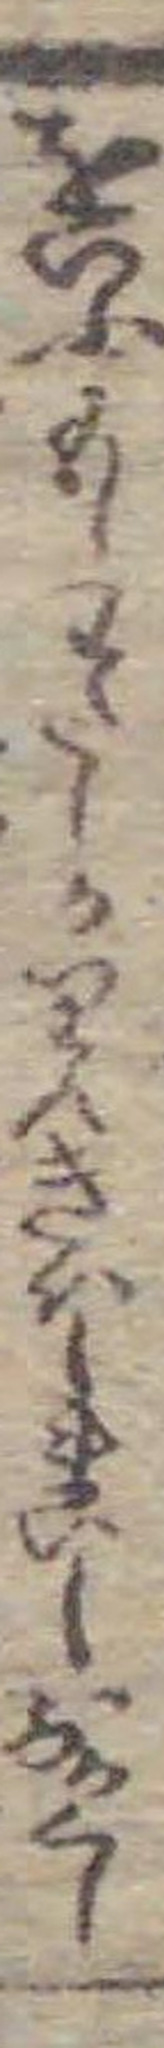をいふもしわたしかりんきはしまいしおかくし
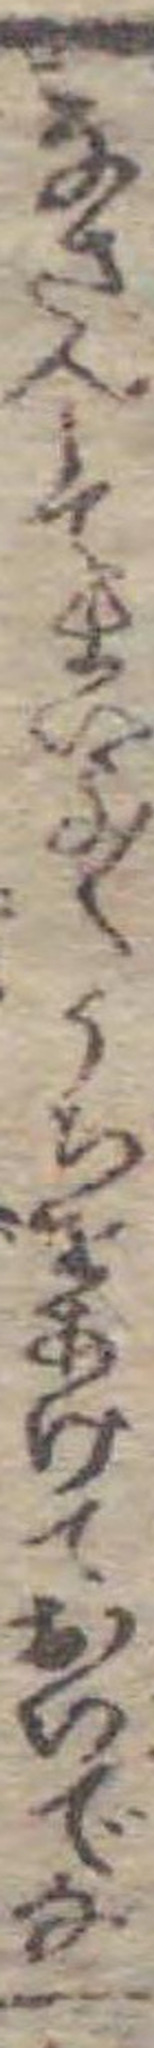なさんしてまいよ〳〵うちをあけておいでな
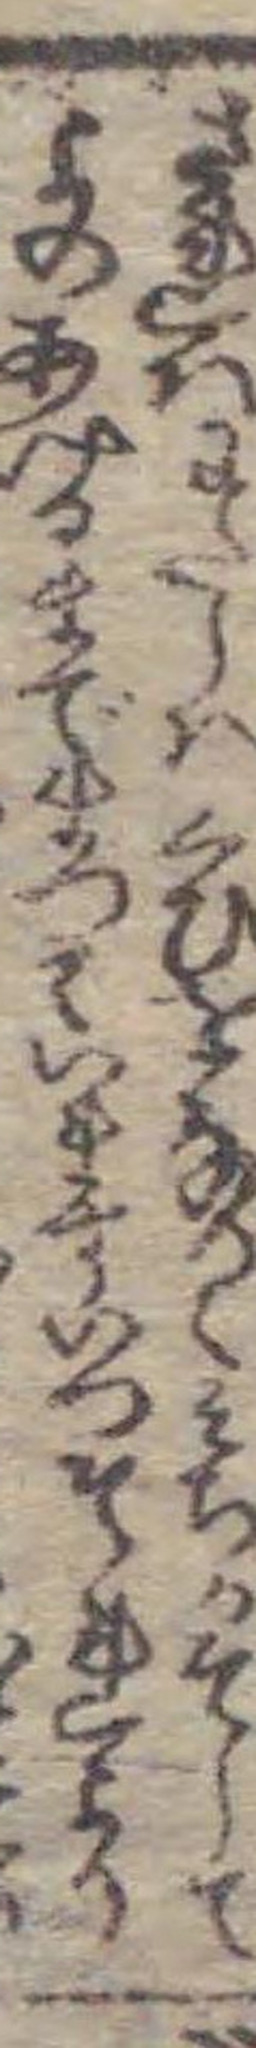よのあけるまでまつていますいつそゝれより
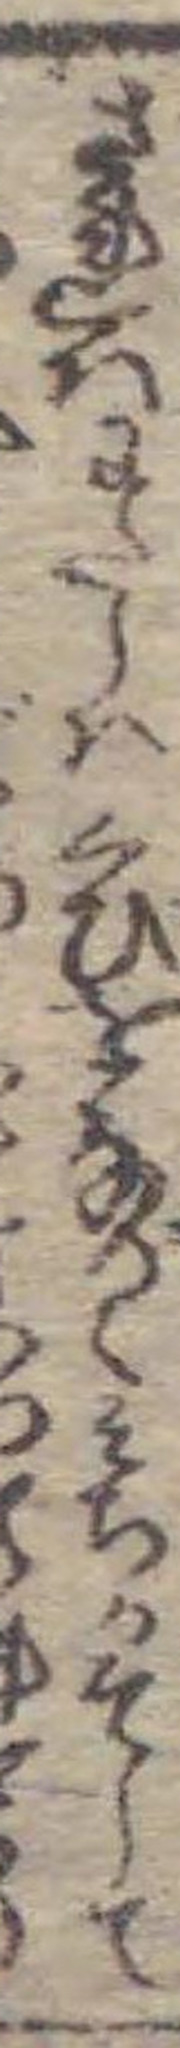されはわたしはくびをながくみちかそして
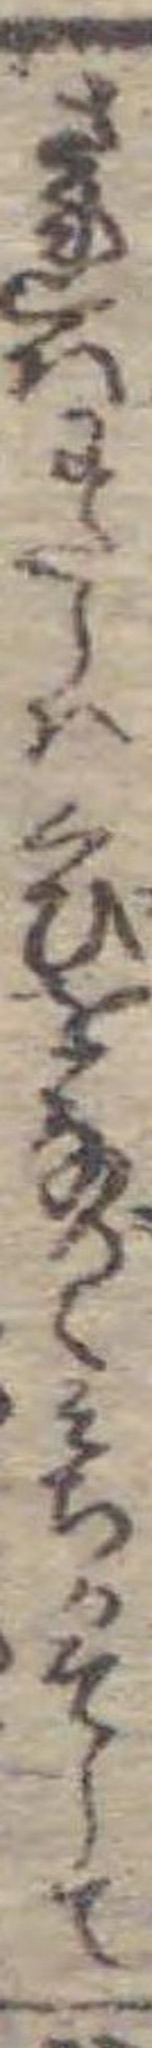されはわたしはくびをながくみちかそして
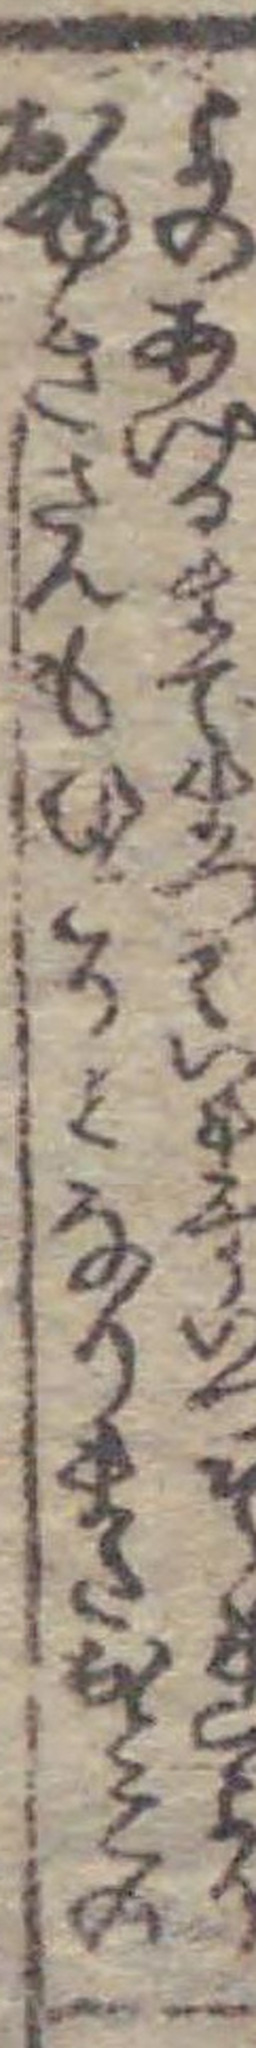おゆきさんもひとりみなりまたおとこの
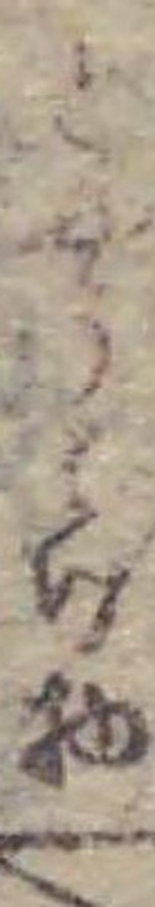とやうばけ物
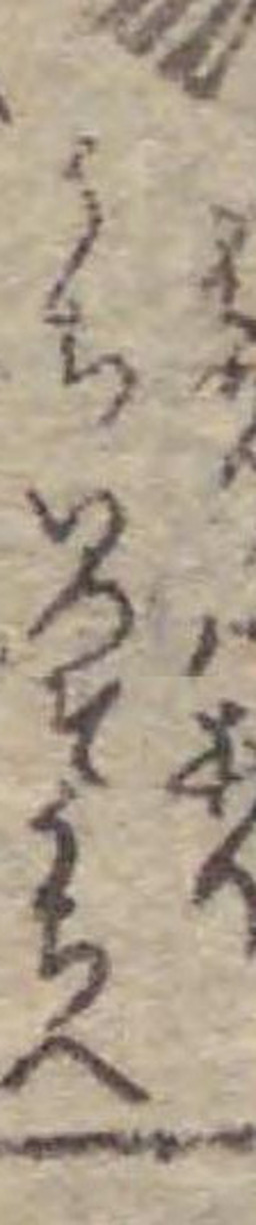うちいつてうちへ
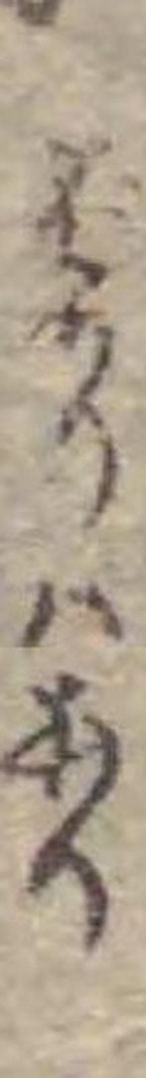ばかりはあり
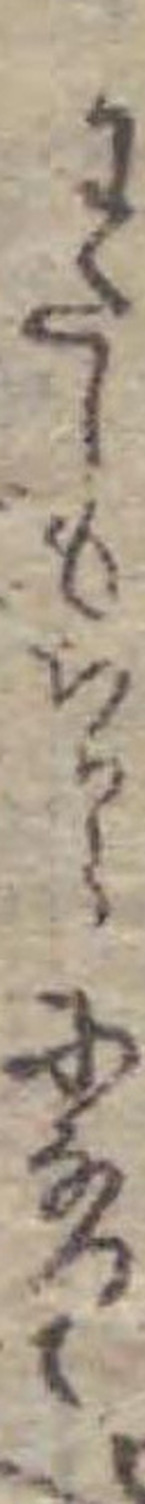わたしもちからになつて
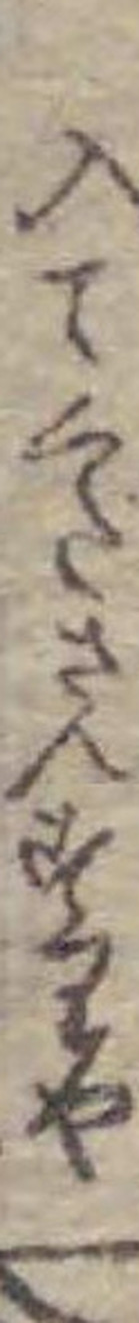入てくださんすりや
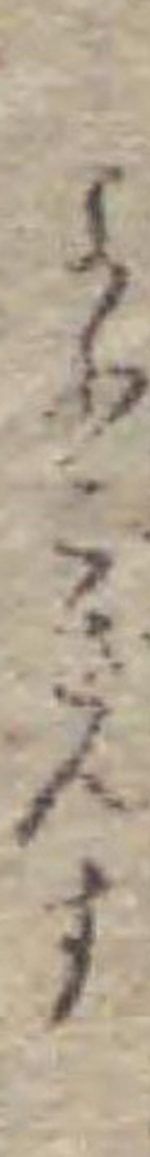よふござんす
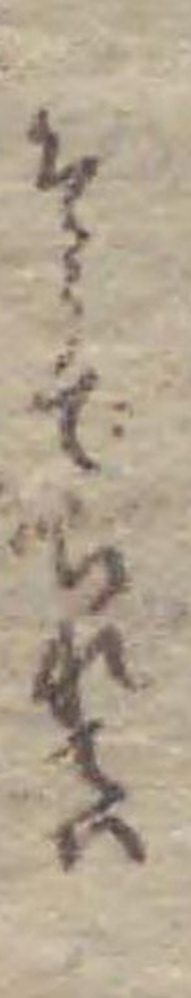そうでられては
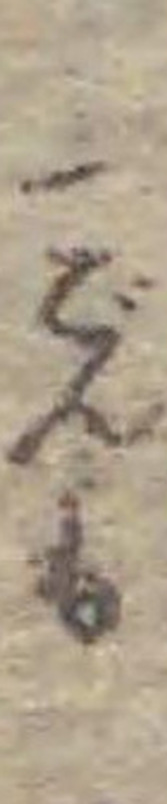一ごんも
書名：[化物一代記] : 5巻
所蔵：国立国会図書館 National Diet Library, JAPAN
